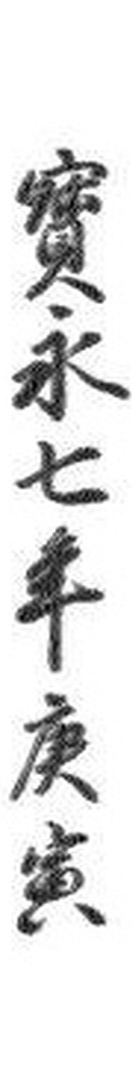宝永七年庚寅
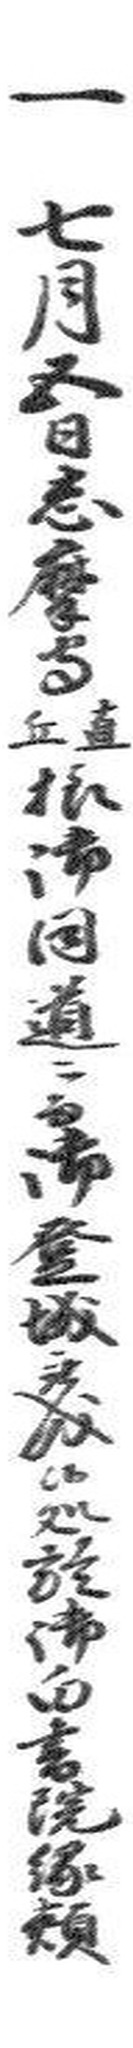一七月五日志摩守直丘様御同道ニ而御登城被成候処於御白書院縁頬
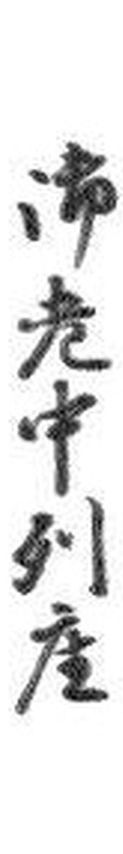御老中列座
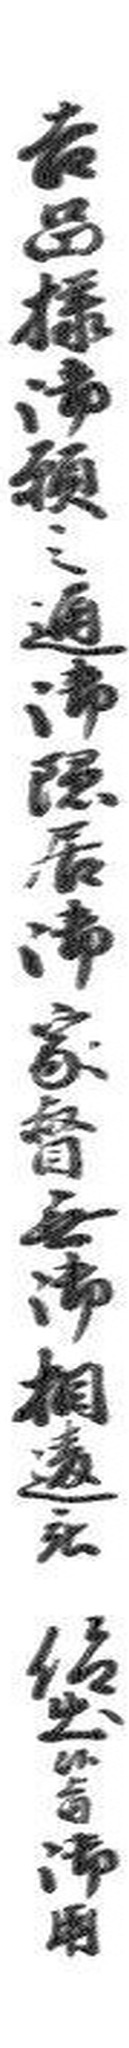吉品様御頼之通御隠居御家督無御相違被仰出候旨御用
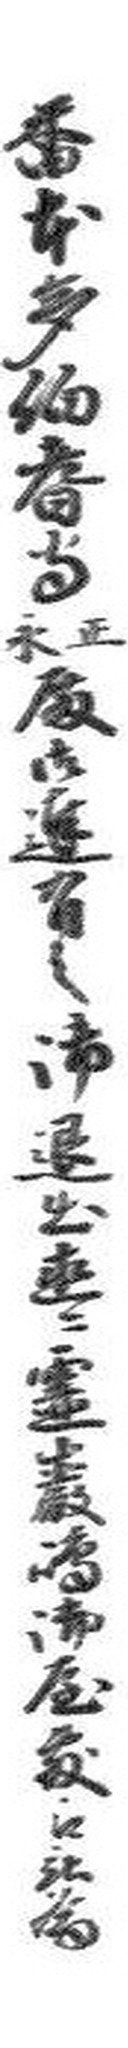番本多伯耆守正永殿御達有之御退出直ニ霊岸島御屋敷江被為
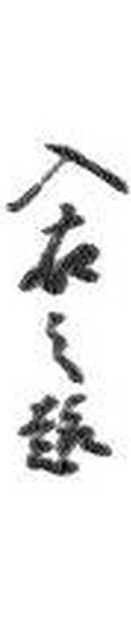入右之趣
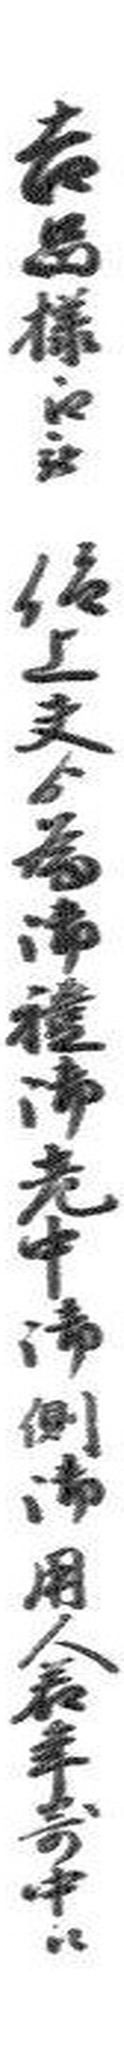吉品様江被仰上夫ゟ為御礼御老中御側御用人若年寄中江

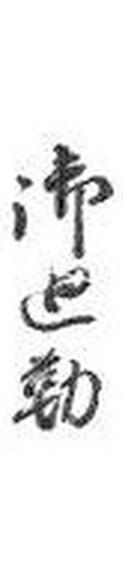御廻勤
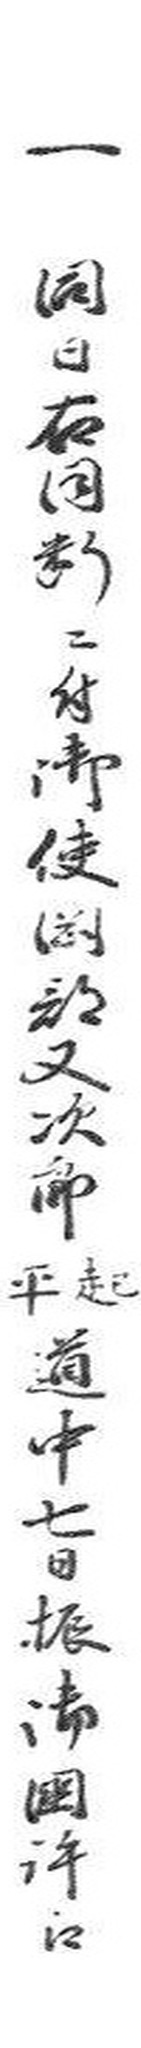一同日右同断ニ付御使岡部又次郎起平道中七日振御国許江
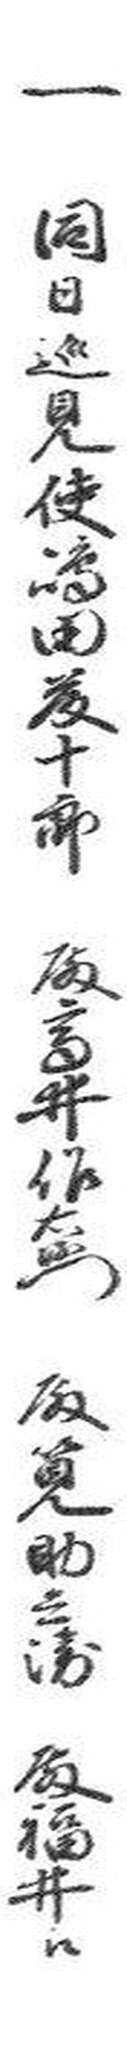一同日巡見使島田藤十郎殿高井作右衛門殿筧助兵衛殿福井江
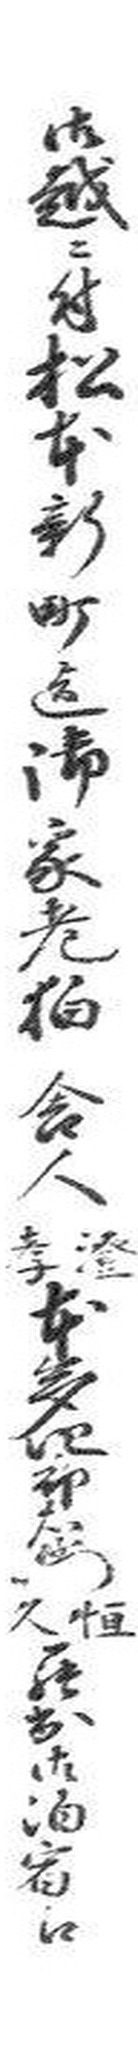御越ニ付松本新町迄御家老狛舎人澄孝本多四郎右衛門恒久罷出御泊宿
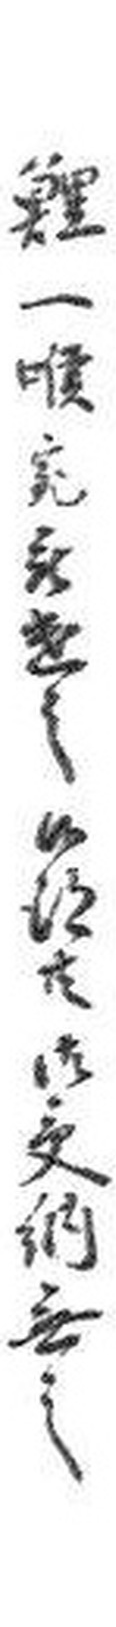鯉一喉宛被遣之候得共御受納無之
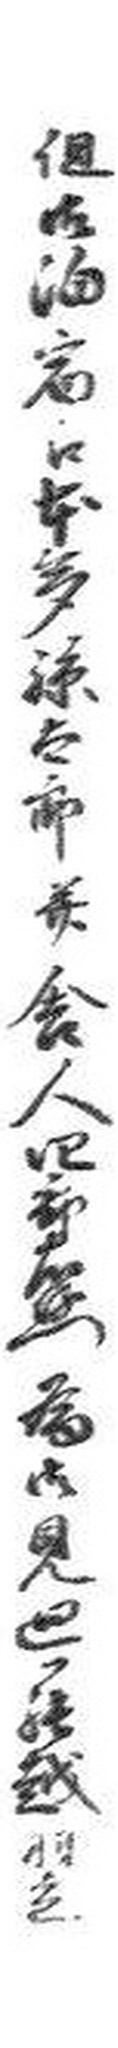但御泊宿江本多孫太郎并舎人四郎右衛門為御見廻罷越翌日
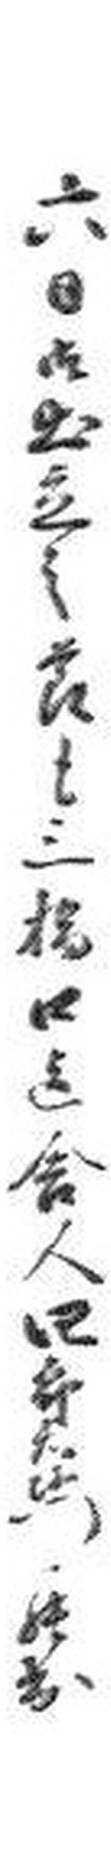六日御出立之節も三橋口迄四郎右衛門罷出
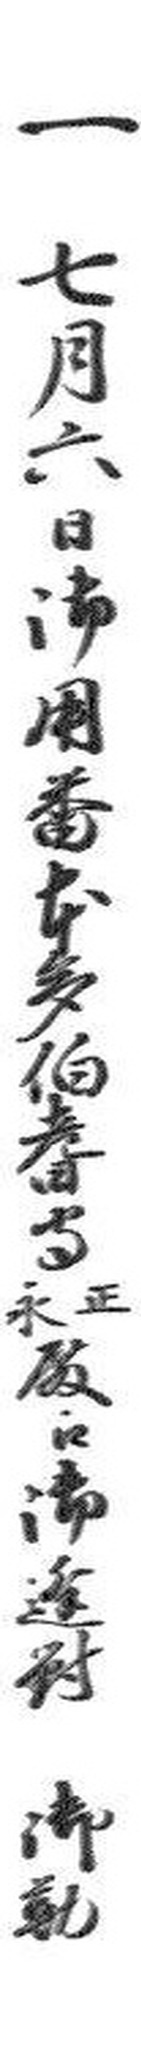一七月六日御用番本多伯耆守正永殿江御逢對御勤
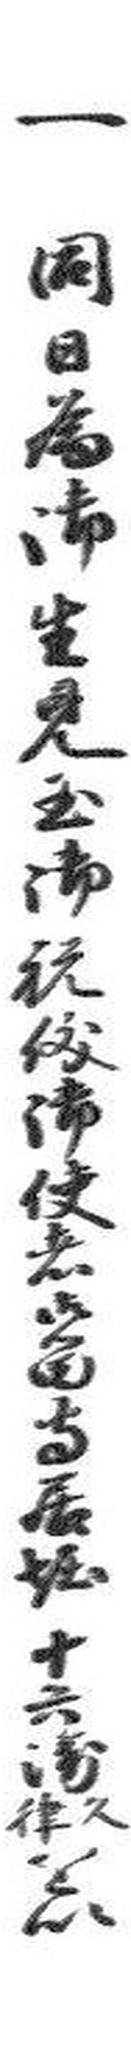一同日為御生見玉御祝儀御使者御留守居堀十兵衛久律を以
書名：家譜 二十八 吉邦公 従宝永七年七月五日到正徳元年十二月
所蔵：福井県文書館 Fukui Prefectural Archives
